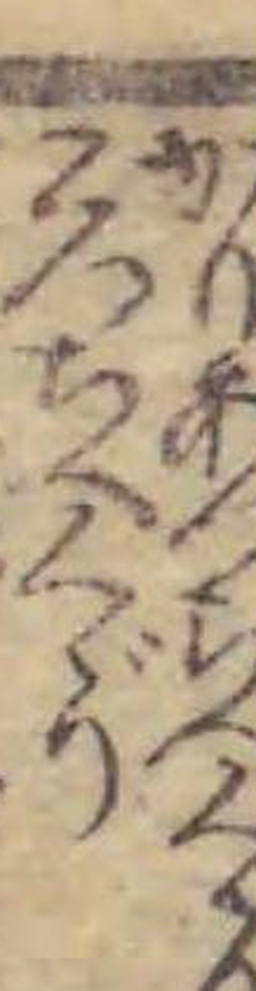こつちへくゞり
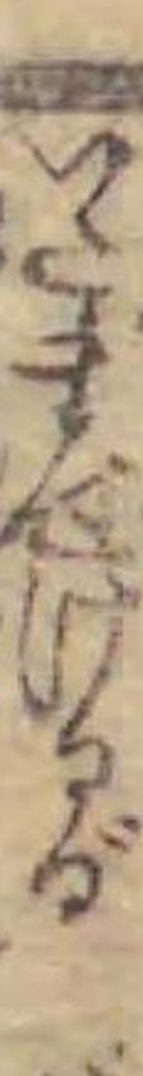いたませけるが
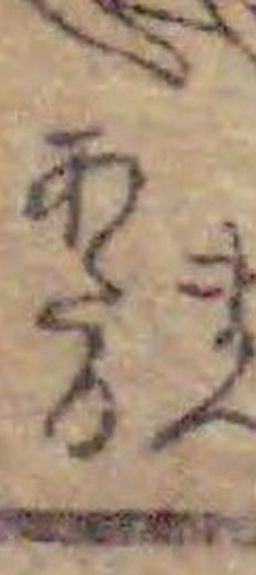あたる
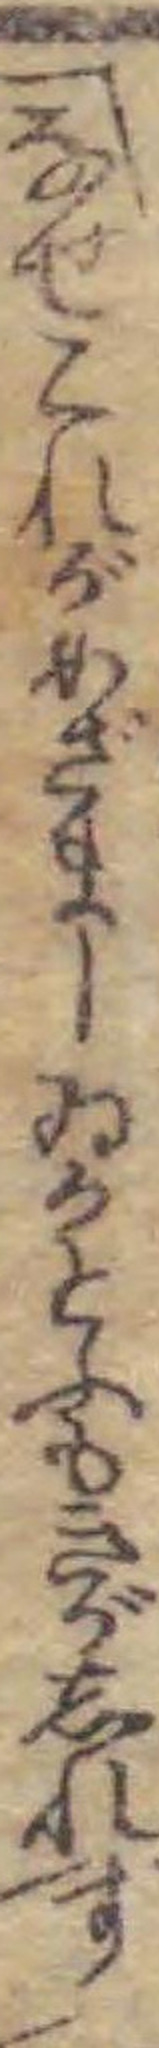〽なせこれがめざましゐかとふもきがしれず
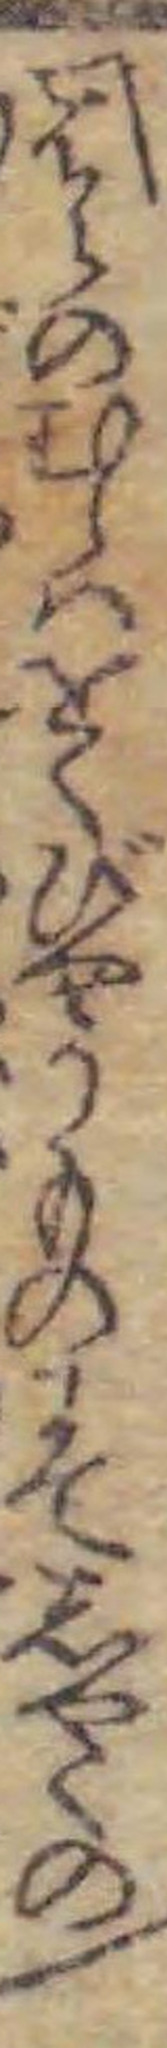〽はらのむしはをくびやうものにてしやくの
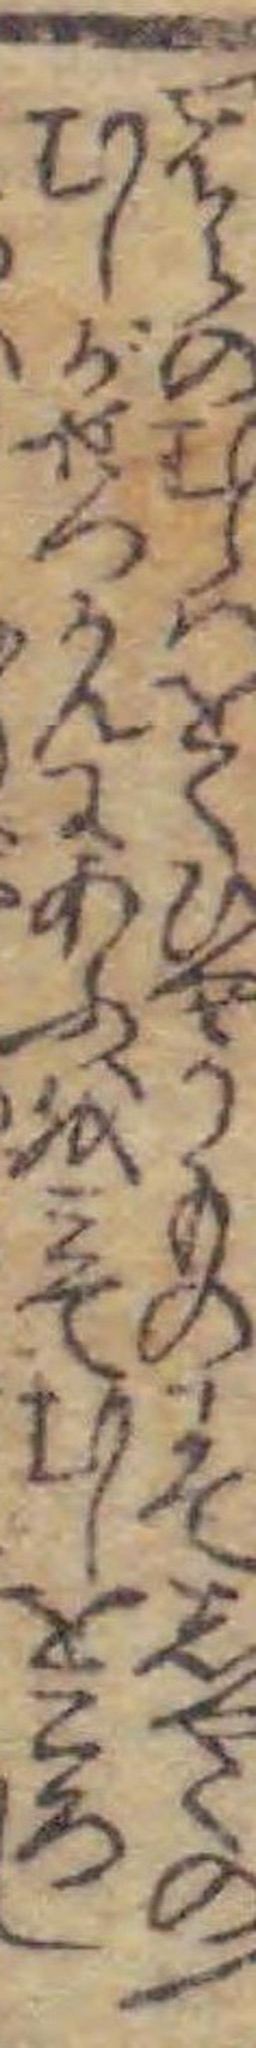むしがせつかんにあふをみてむしをころし
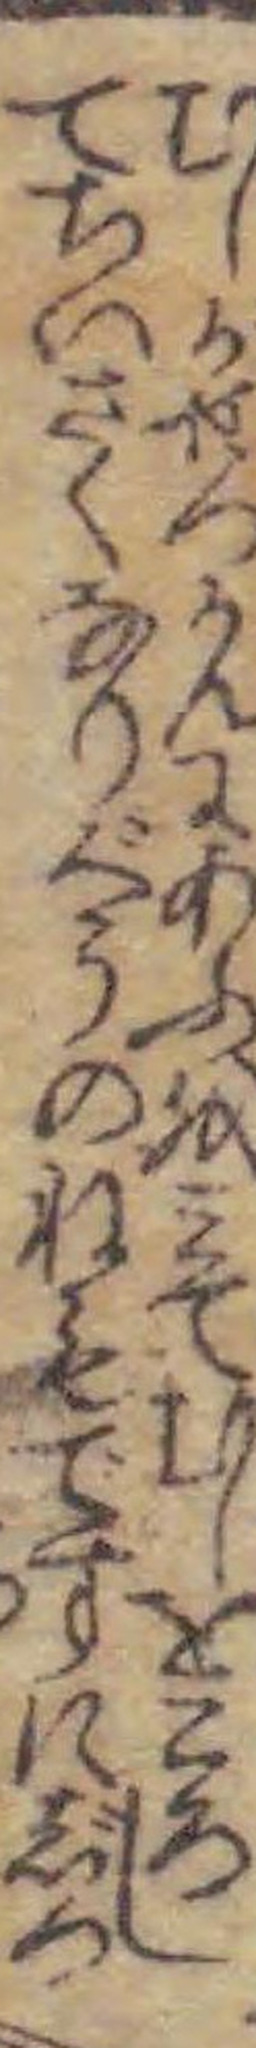てちいさくなりぐうのねもですにじつ
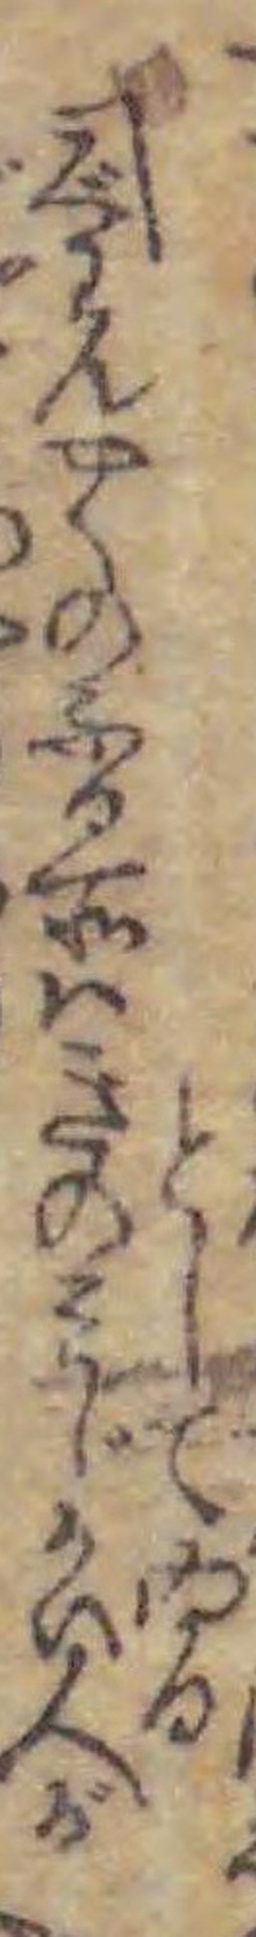〽ぐわんやくのふる所はきのみじかい人が
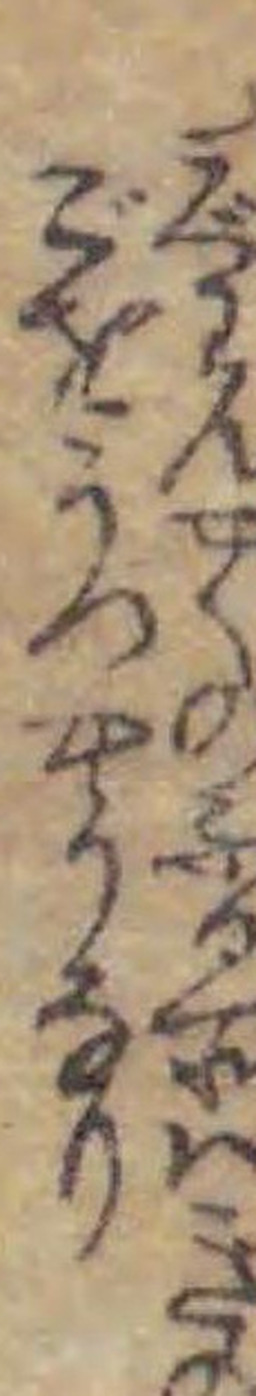ごをうつやうなり
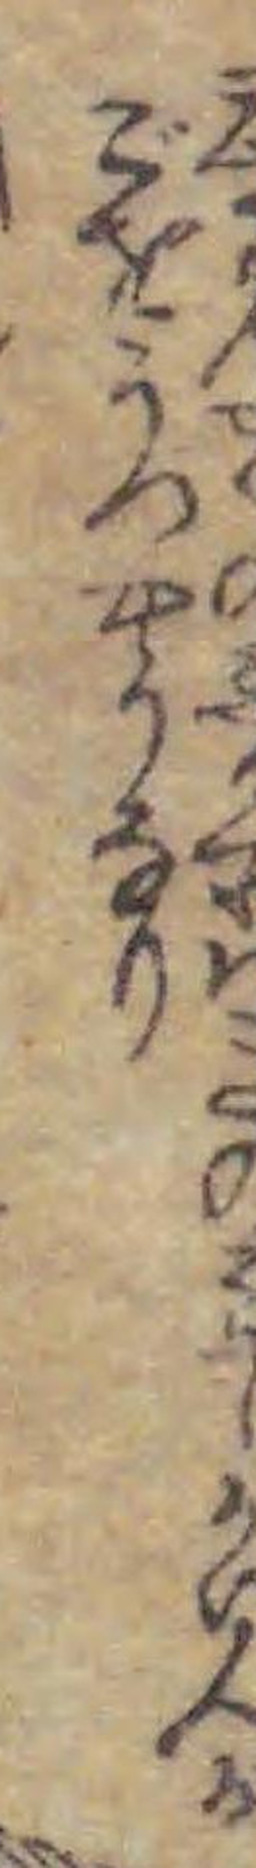ごをうつやうなり
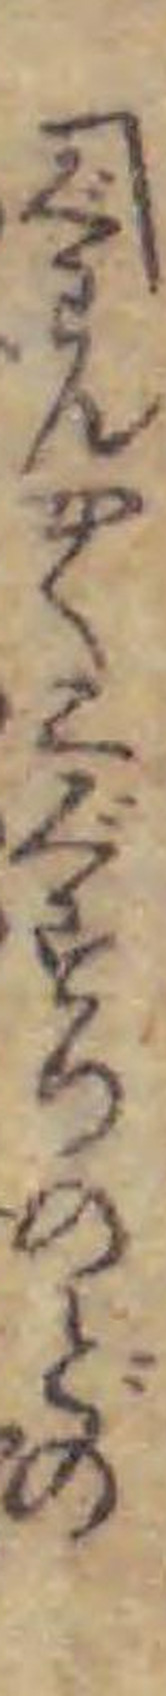〽ぐわんやくこぐすりのどの
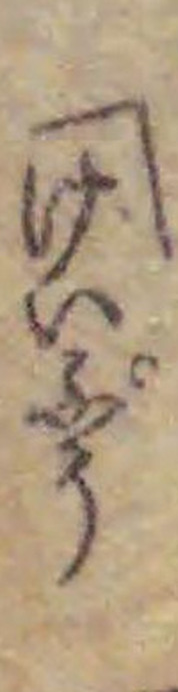〽けいぷう
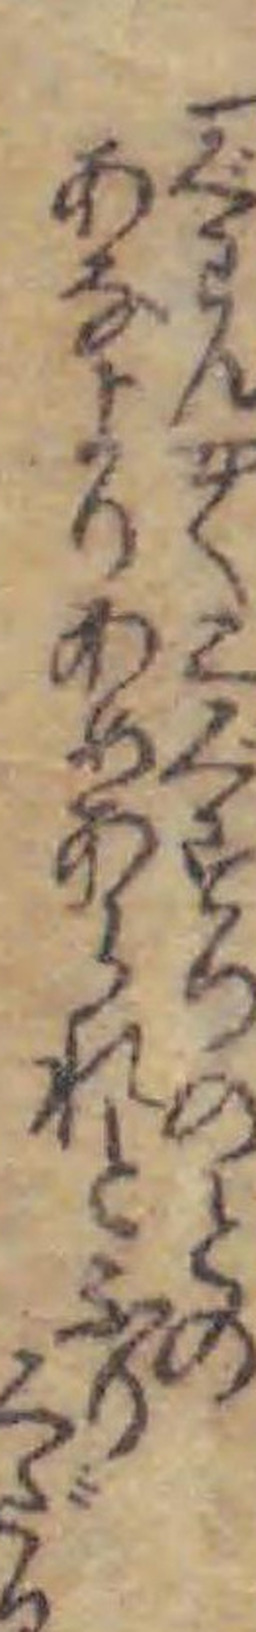あなよりあめあられとふり
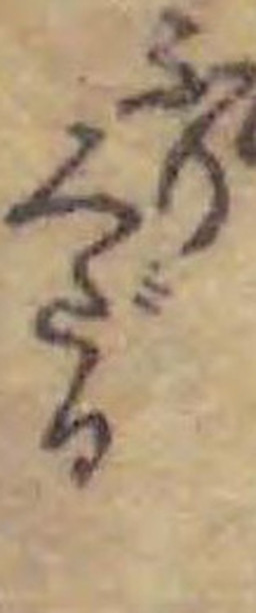くだる

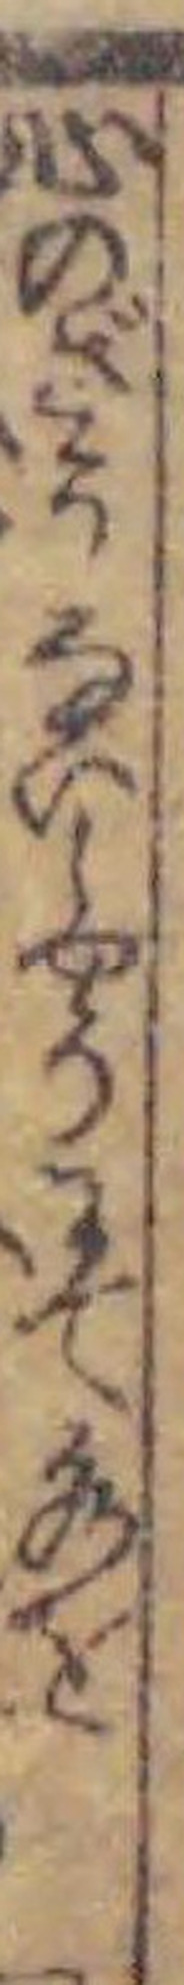心のざうないしやうにて水を
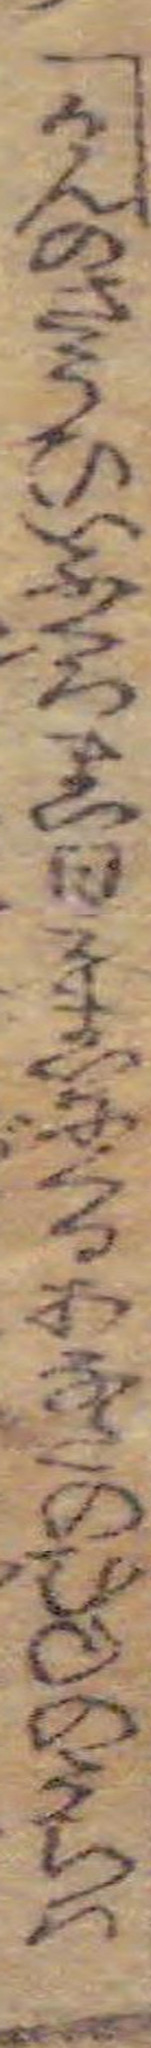〽かんのさうひいふくろまい日みまいにくるあなたのひねのうちは
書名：十四傾城腹之内 : 3巻
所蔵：国立国会図書館 National Diet Library, JAPAN
